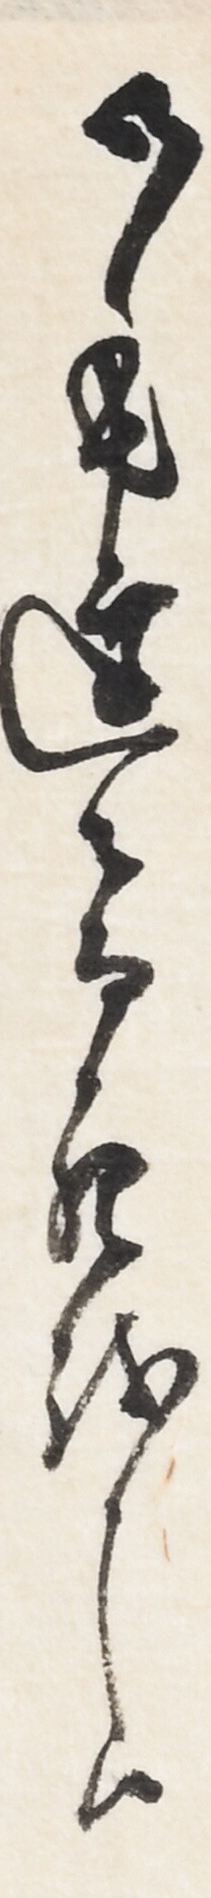御用達ニ而罷越申候
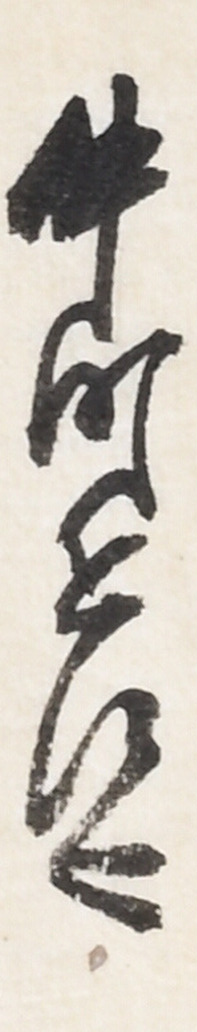中町近江屋
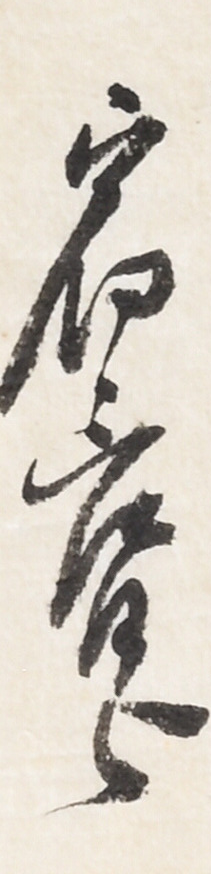宿宇兵衛
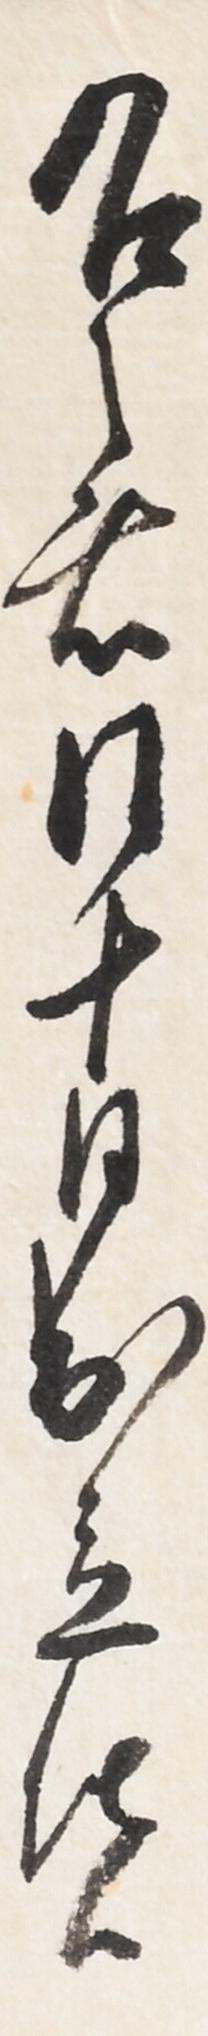右之者同十日出立仕候
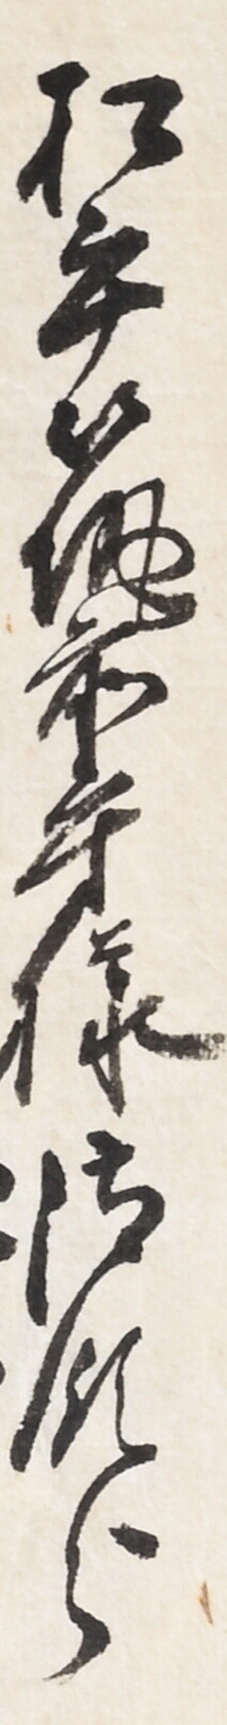松平筑前守様御領分
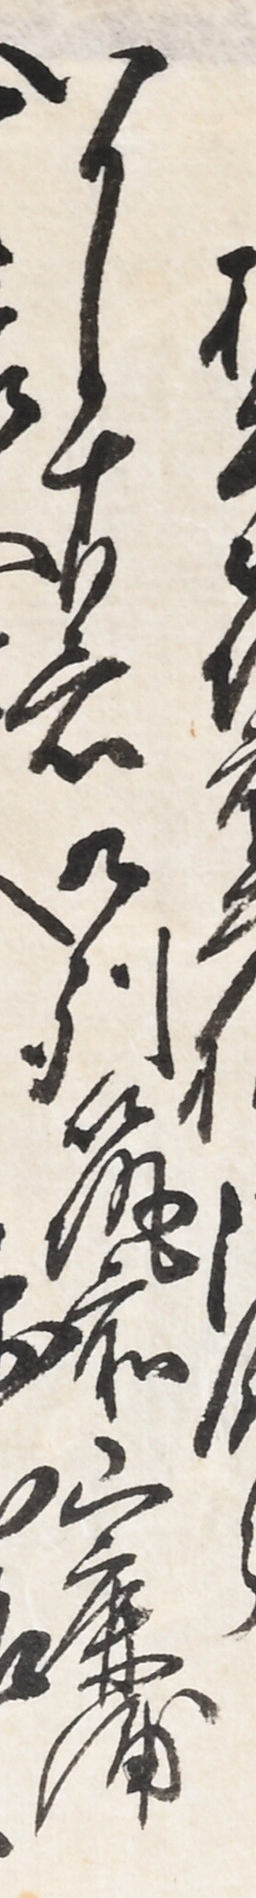八月十日着九州筑前山鹿浦
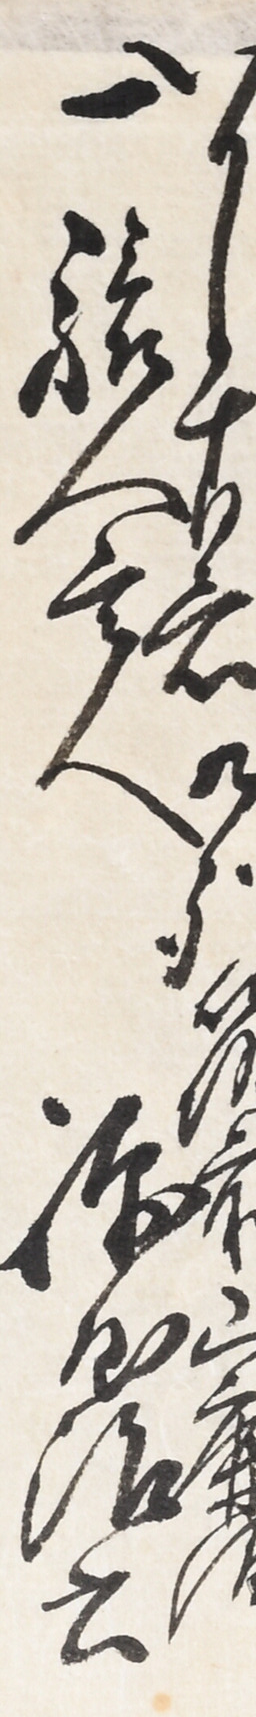一旅人壱人綿屋治六
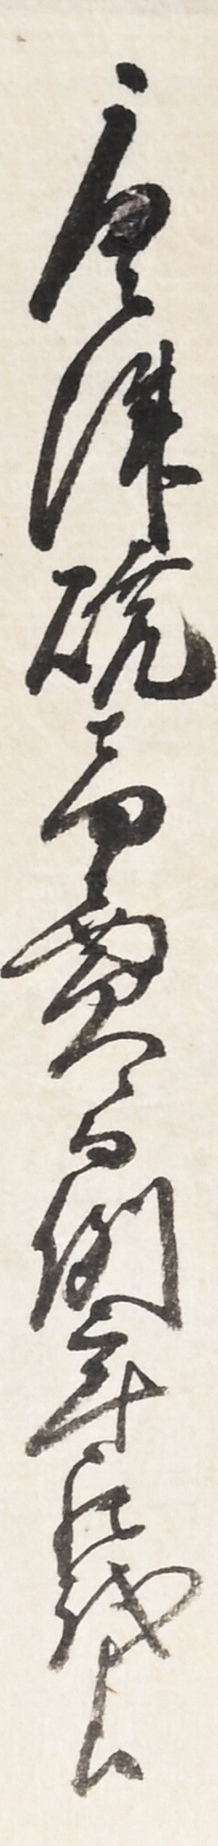唐津焼商売ニ而例年罷越申候
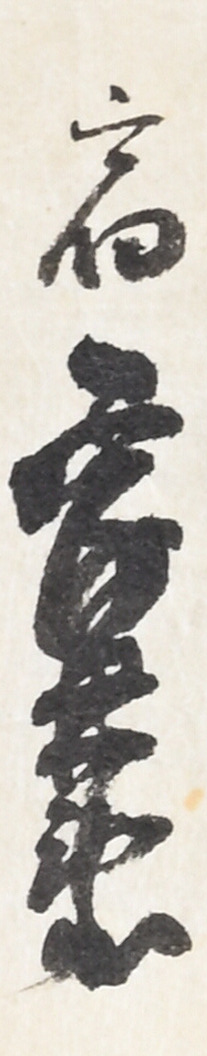宿宇兵衛
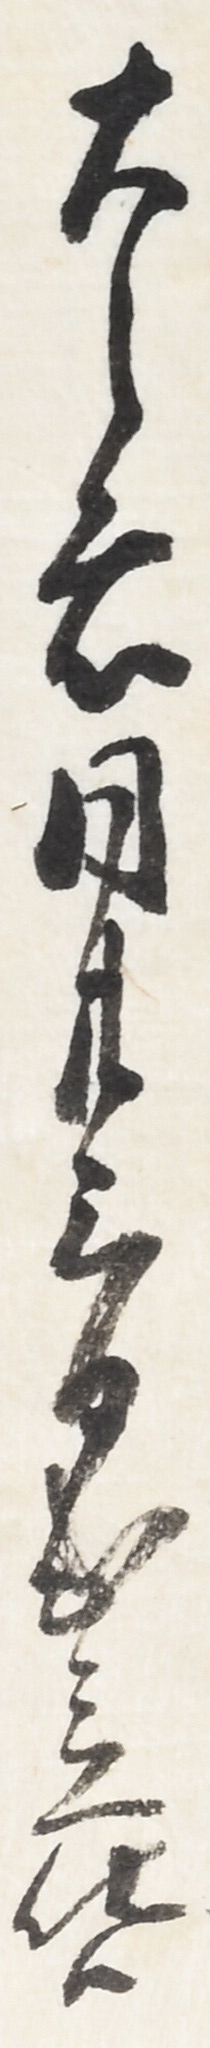右之者同廿三日出立仕候
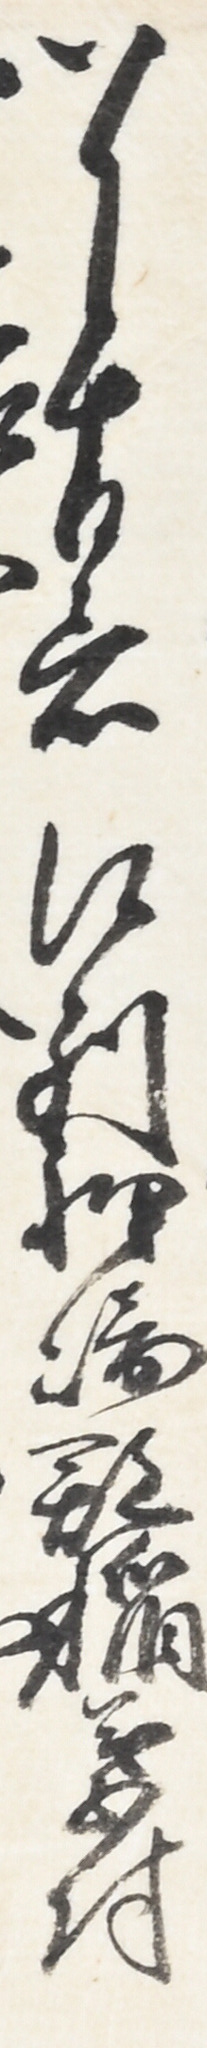八月十日着江州神崎郡稲葉村
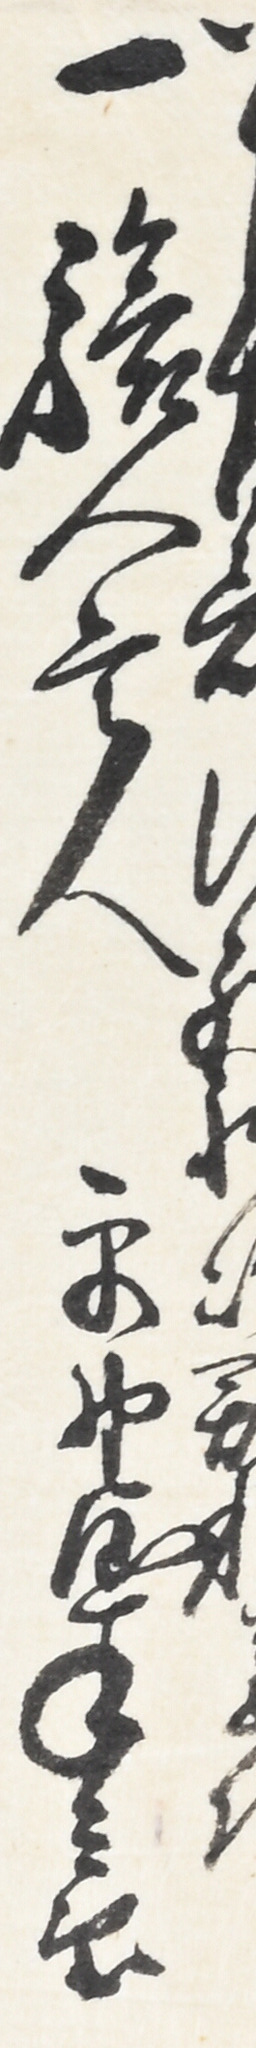一旅人壱人平野屋半兵衛
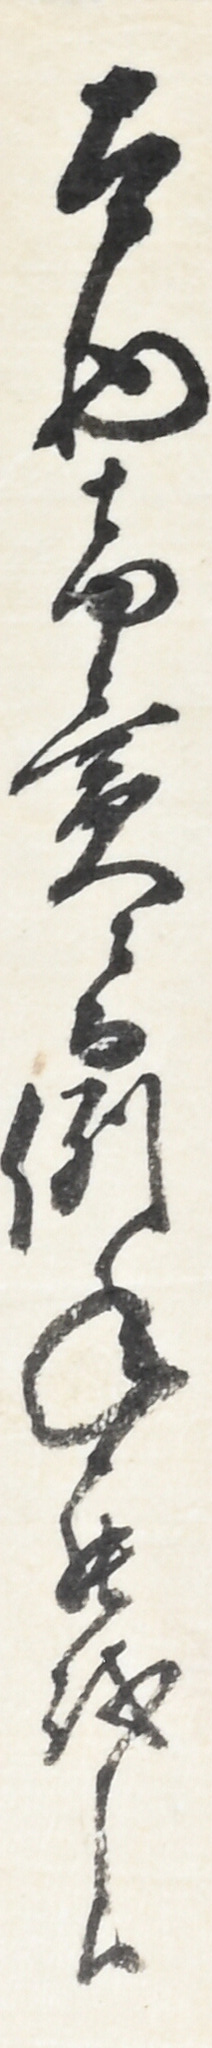太物商売ニ而例年罷越申候
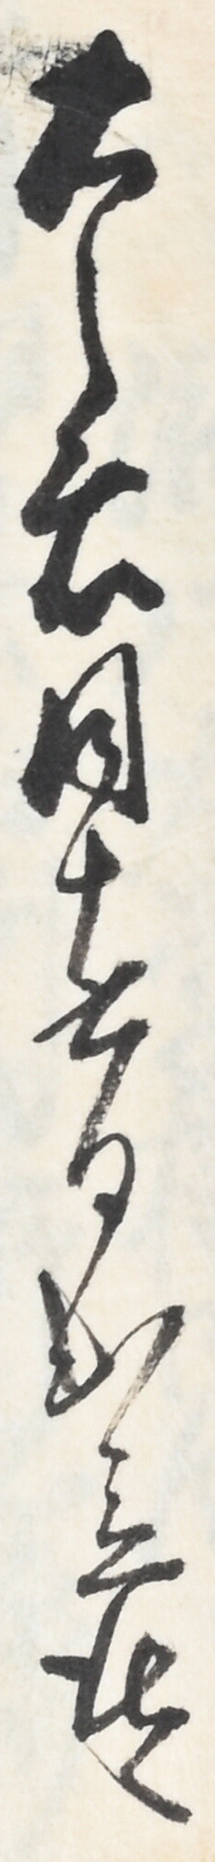右之者同十日出立仕候

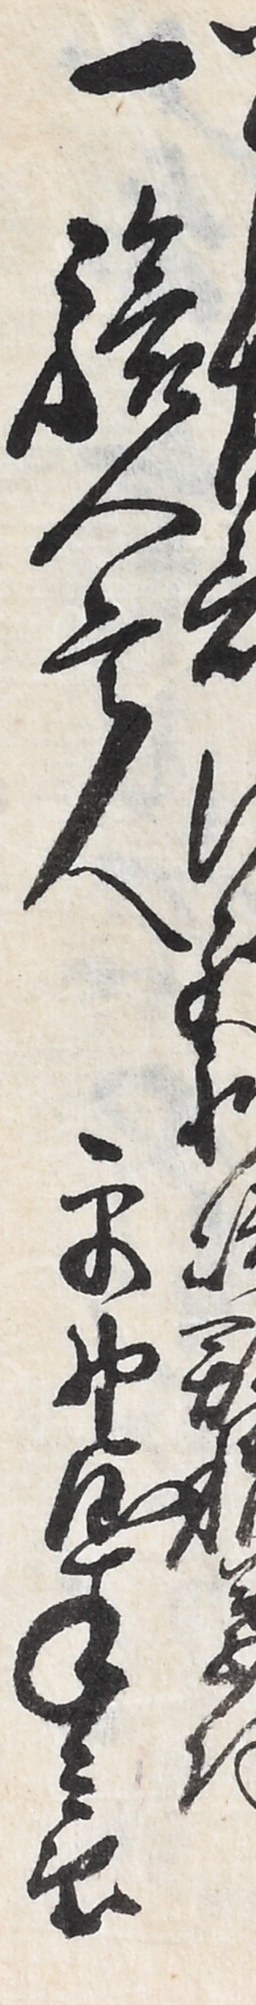一旅人壱人油や吉兵衛
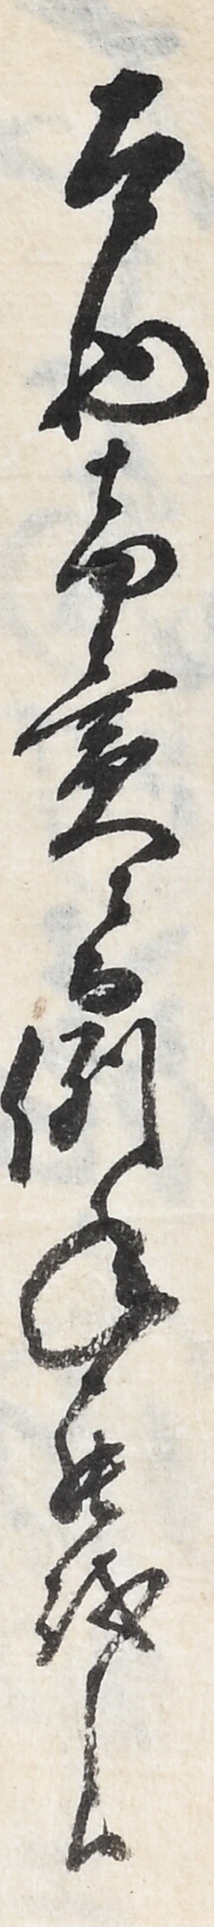油商売ニ而例年罷越申候
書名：旅人泊控帳
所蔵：伊那市立高遠町図書館・合同会社AMANE
